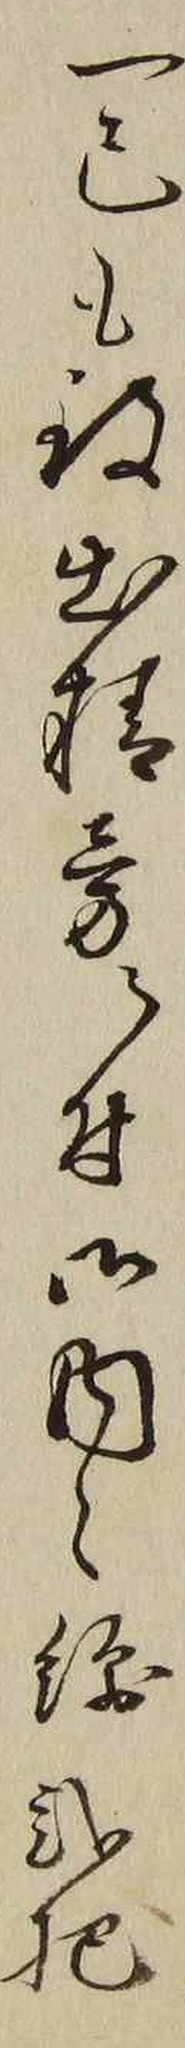一己も致出精旁に付御内々綿弐把
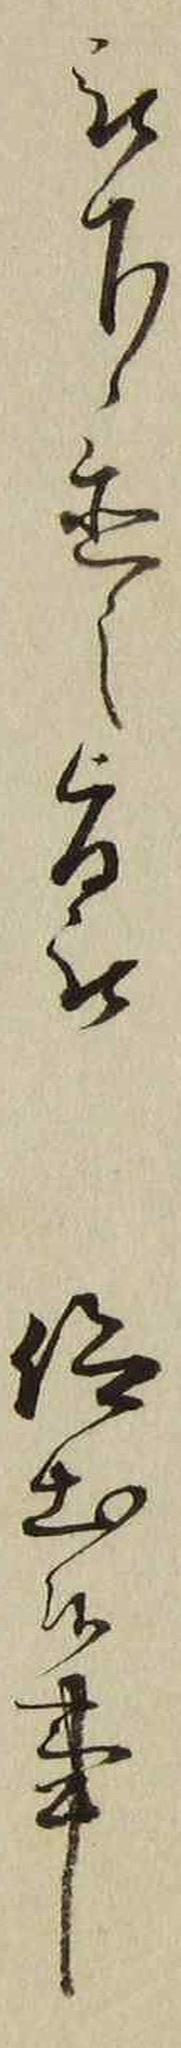被下置の旨被仰出候事
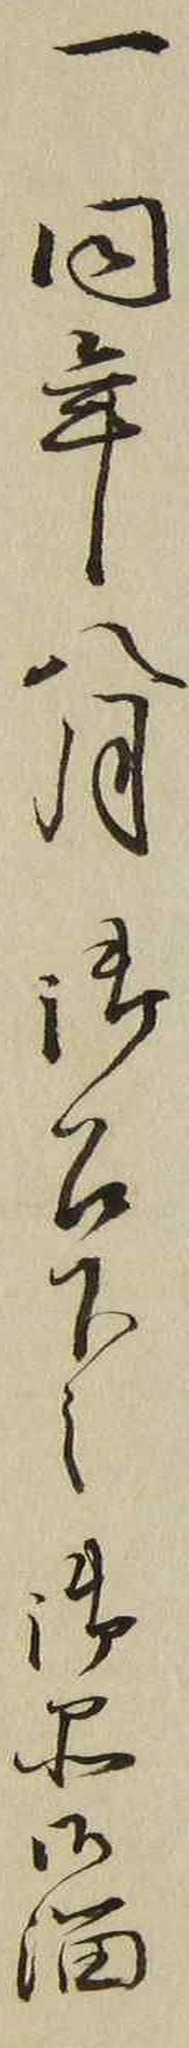一同年八月御召下の御品御酒

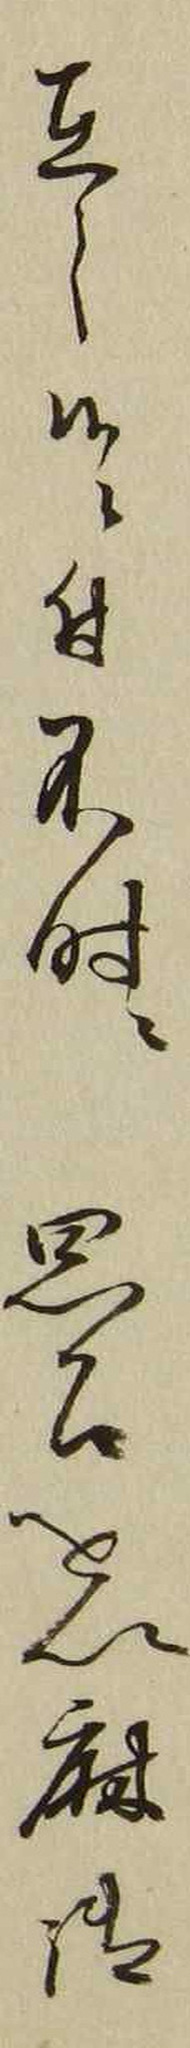在之候に付不時に思召を以麻御
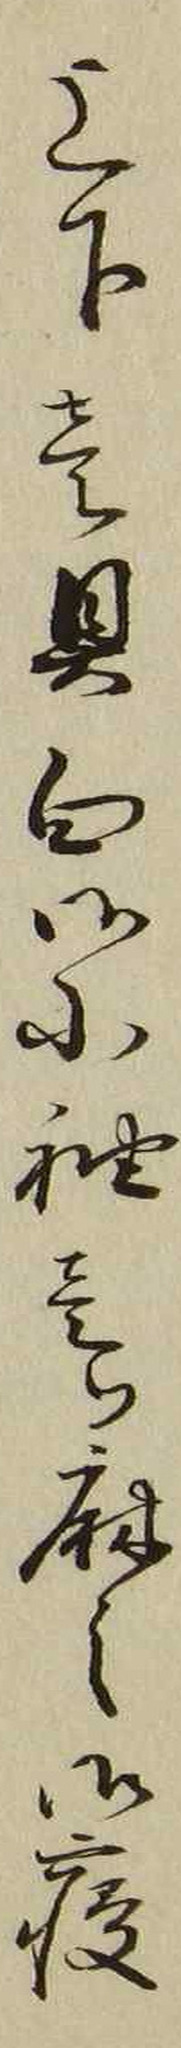上下壱具白御小袖壱ツ麻の御寝
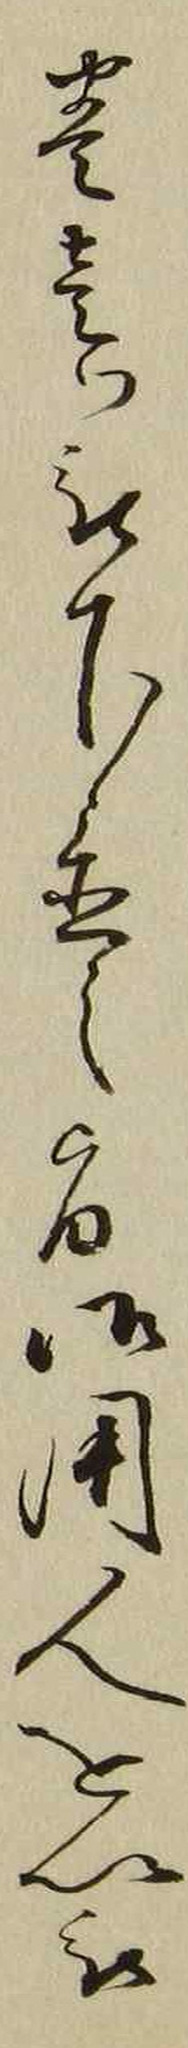巻壱ツ被下置の旨御用人を以被
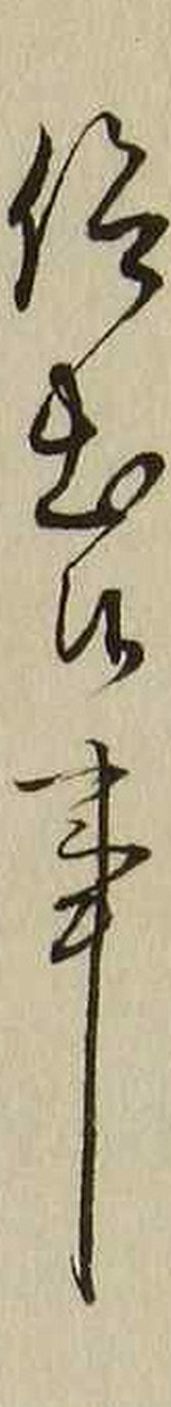仰出候事
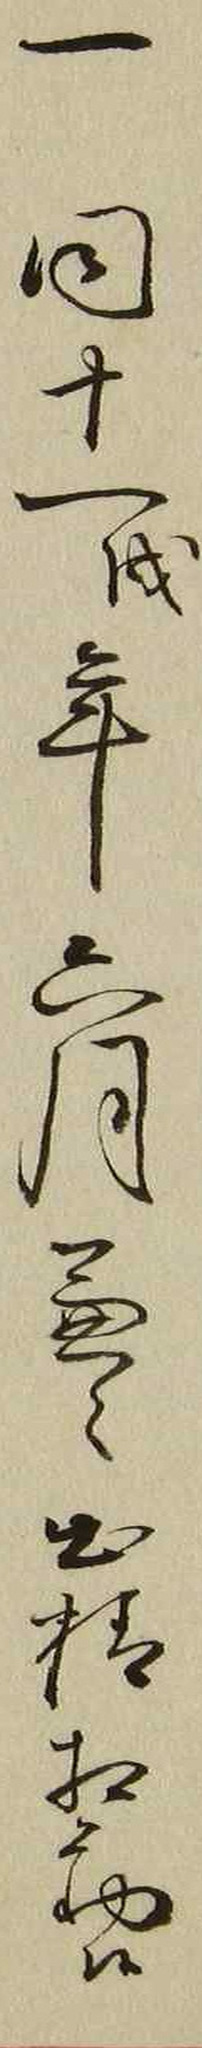一同十一戌年六月兼々出精相勤候
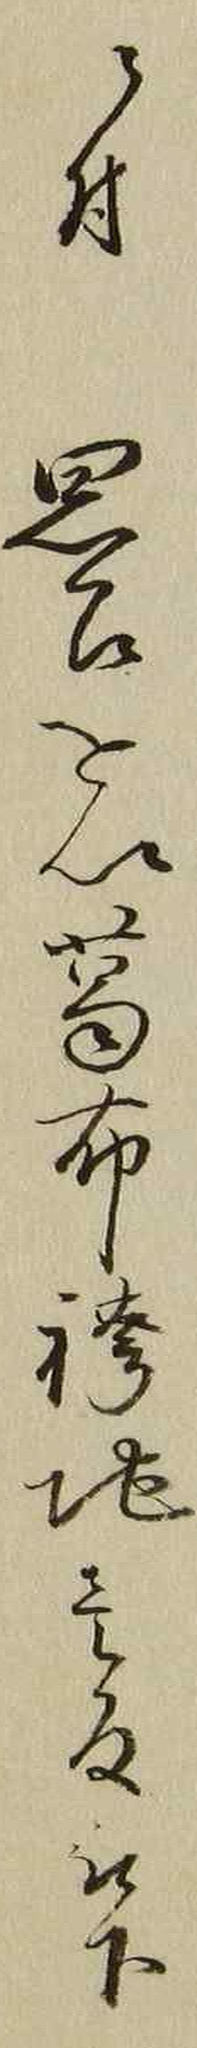に付思召を以葛布袴地壱反被下
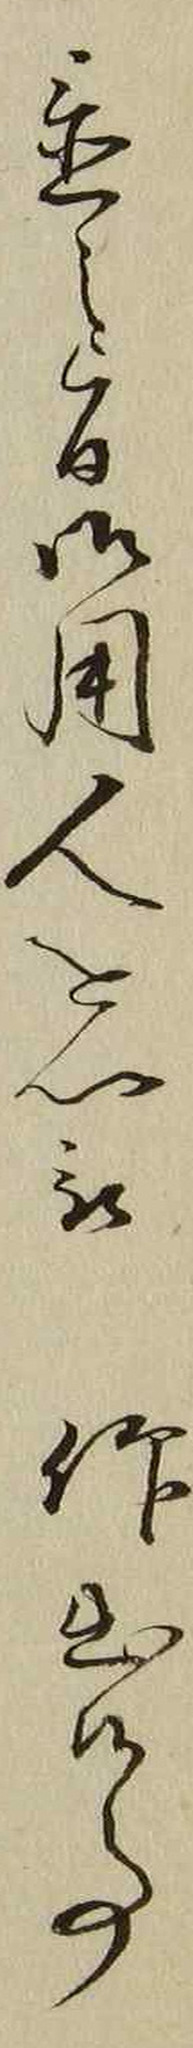置の旨御用人を以被仰出候事
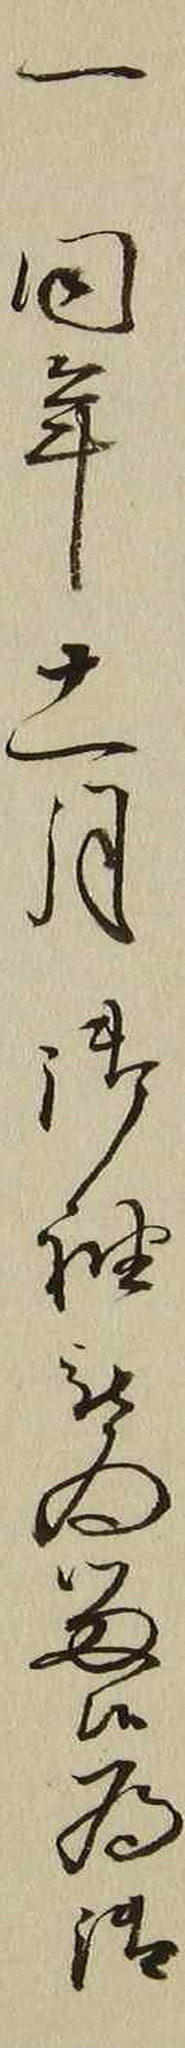一同年十一月御袖被為留候為御
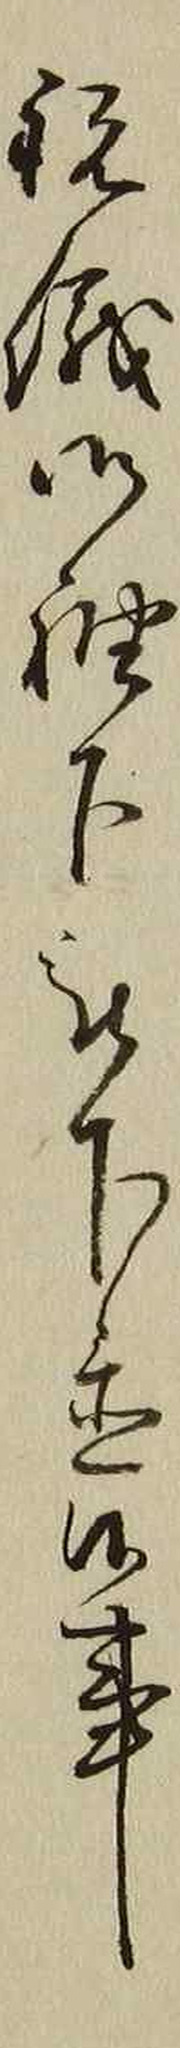祝儀御袖下被下置候事
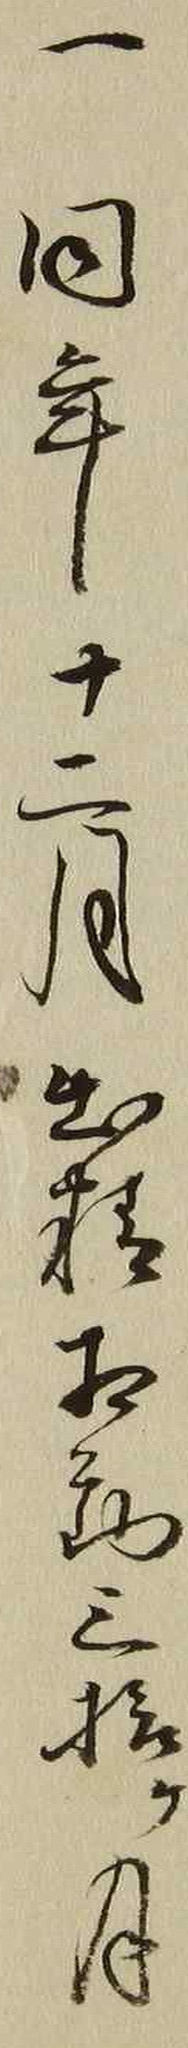一同年十二月出精相勤三拾ケ月
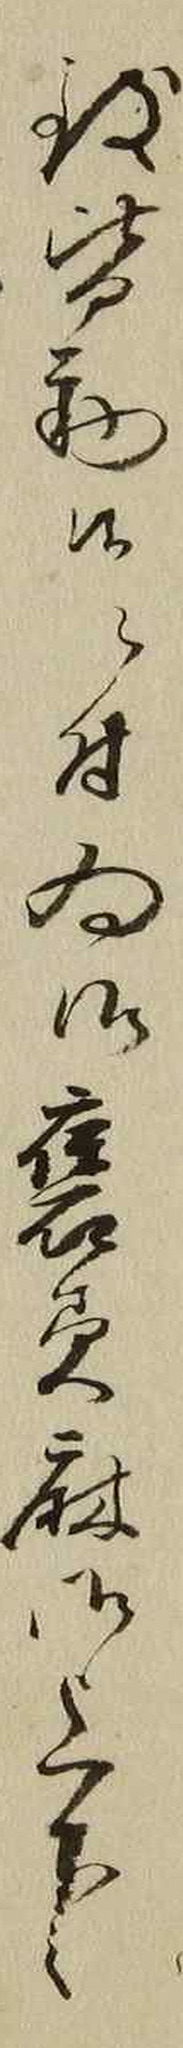致皆勤候に付為御褒美麻御上下の
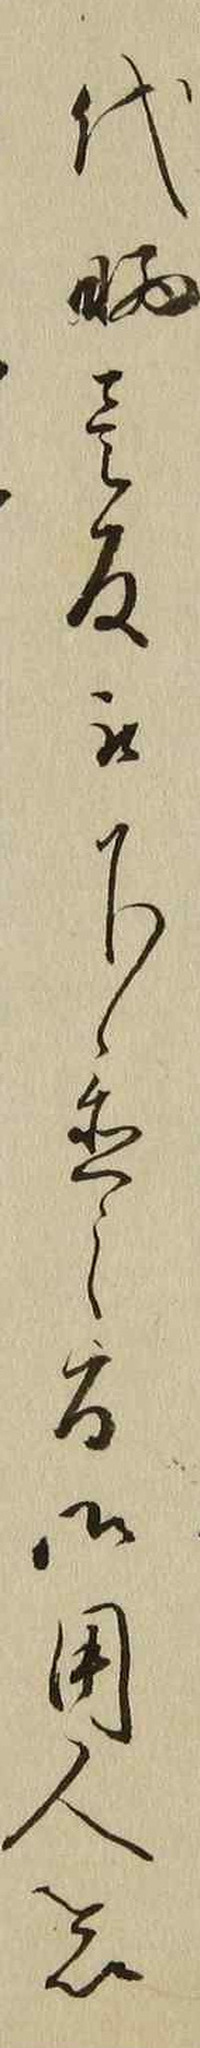代晒壱反被下置の旨御用人を以
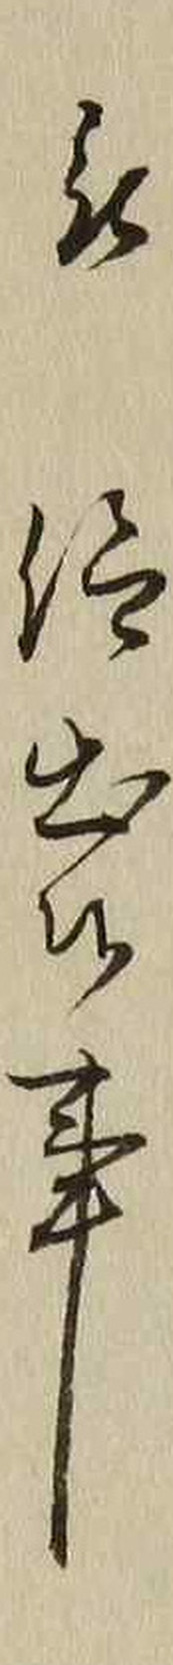被仰出候事
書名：諸士系譜　巻之1　い之部1
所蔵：会津若松市立会津図書館
